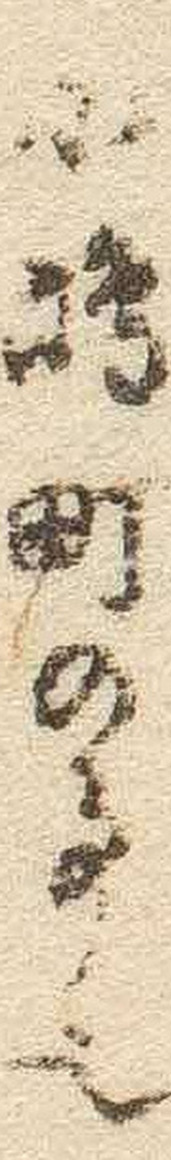北島町の事也
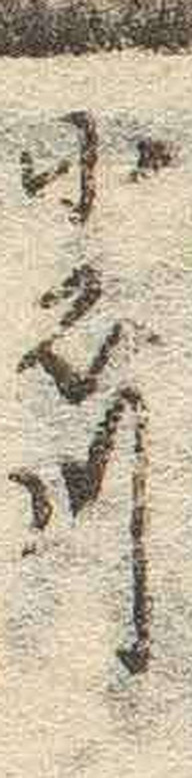小石川
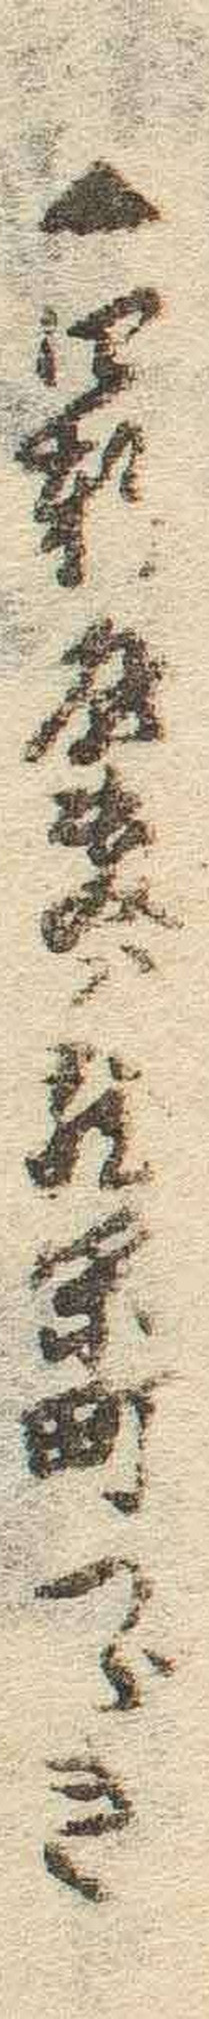▲四軒屋敷は龍閑町つゞき
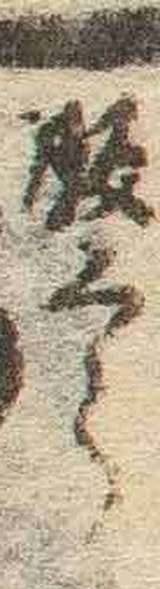飯くら

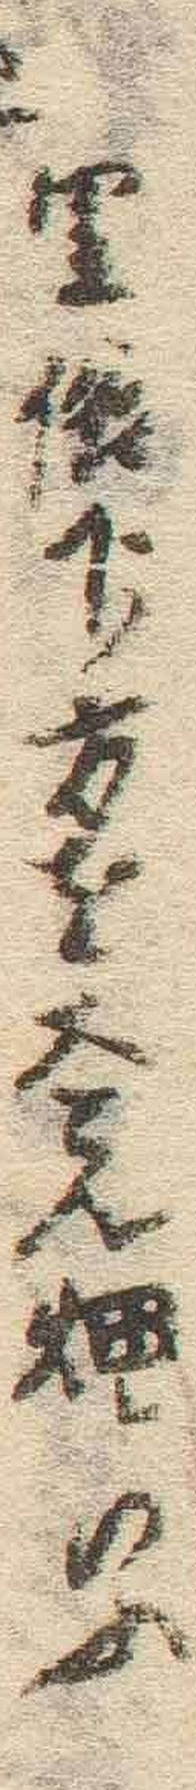里俗下ノ方を大こん畑トいふ
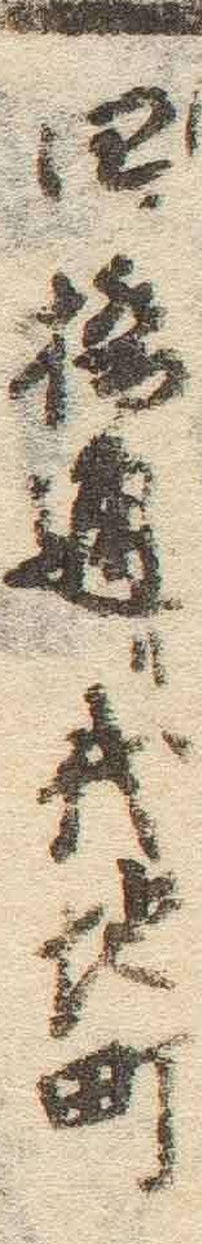四ノ橋通り代地町
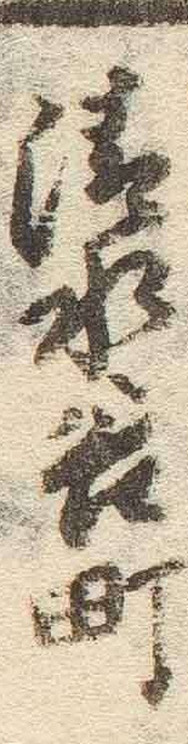清水谷町
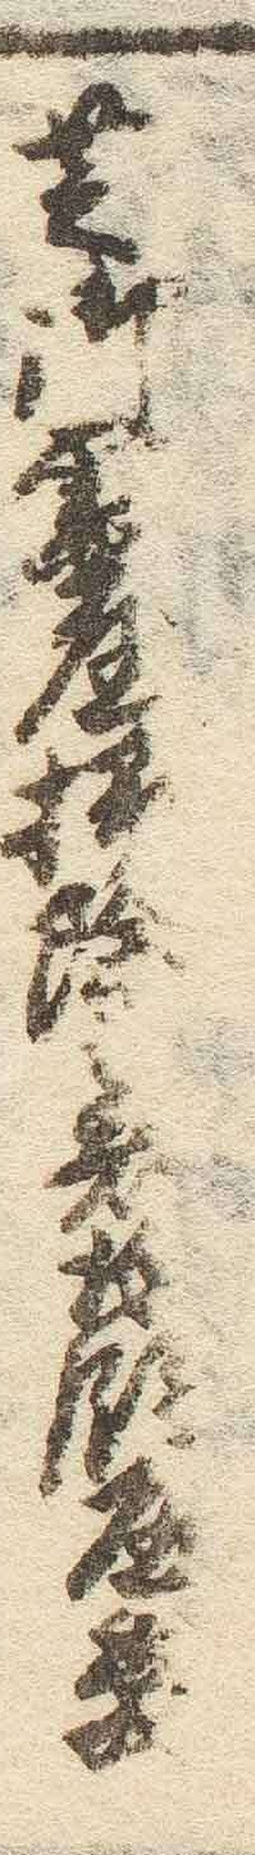芝御霊屋掃除之者拝領屋敷
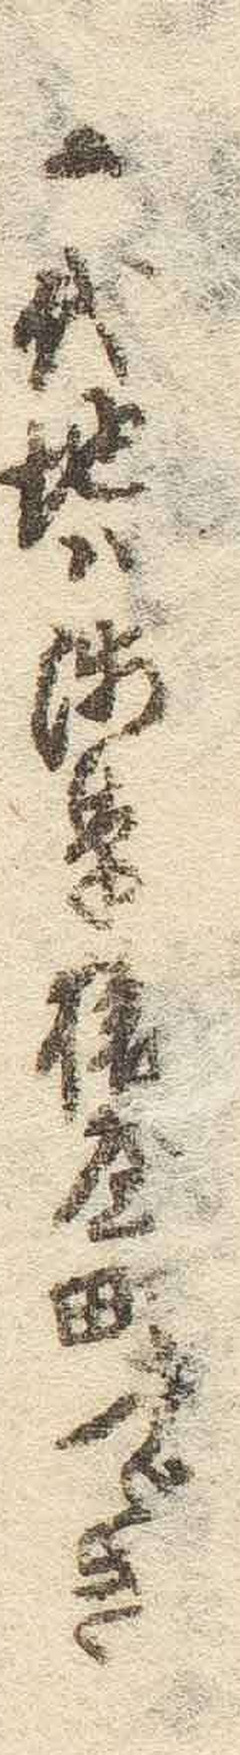▲代地は浅草猿屋町つゞき
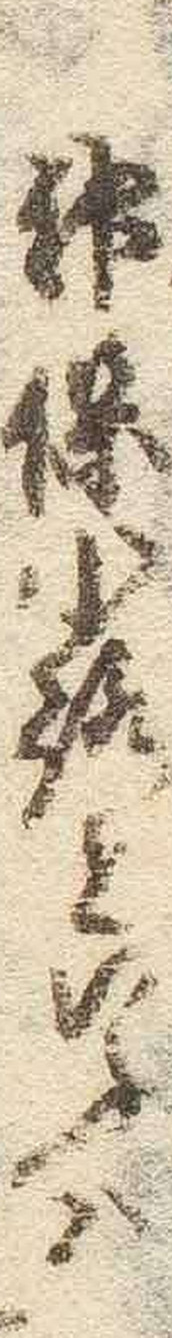神保小路といふは
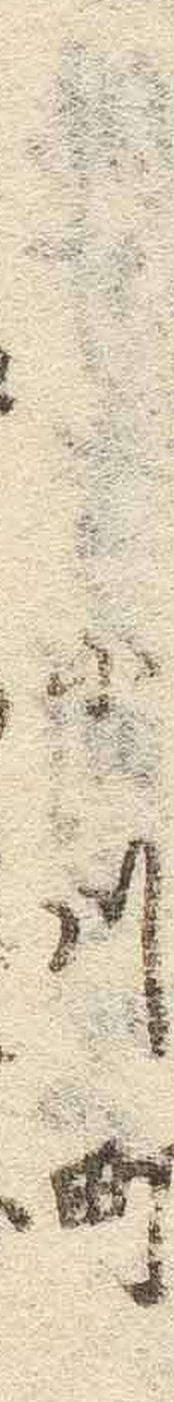小川町
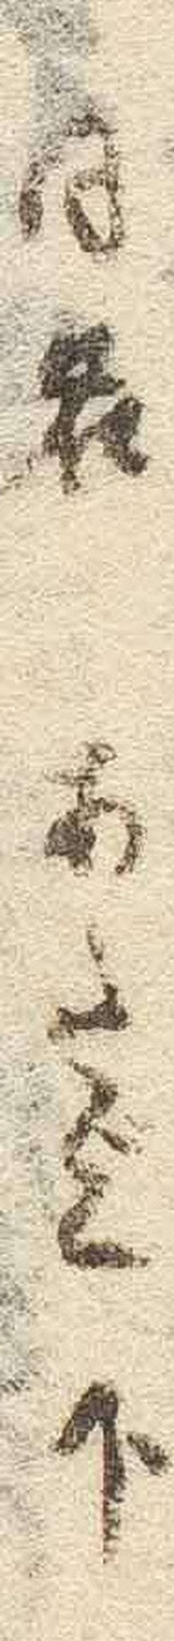同名あたご下
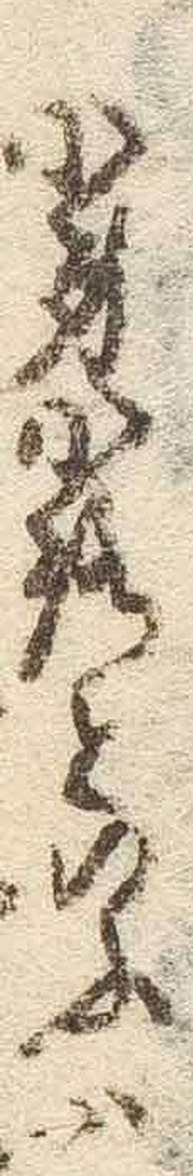小身小路といふは
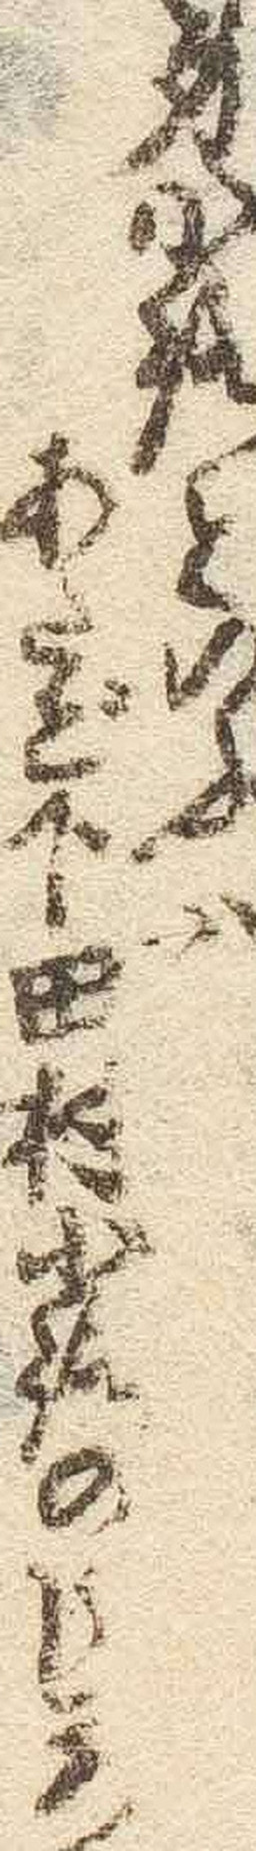あたご下田村小路のうしろ
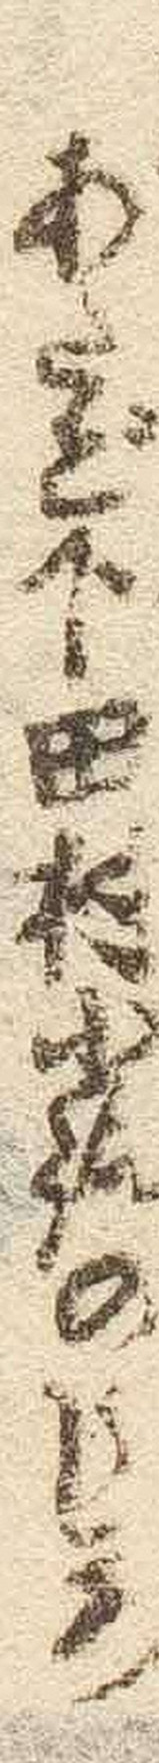あたご下田村小路のうしろ
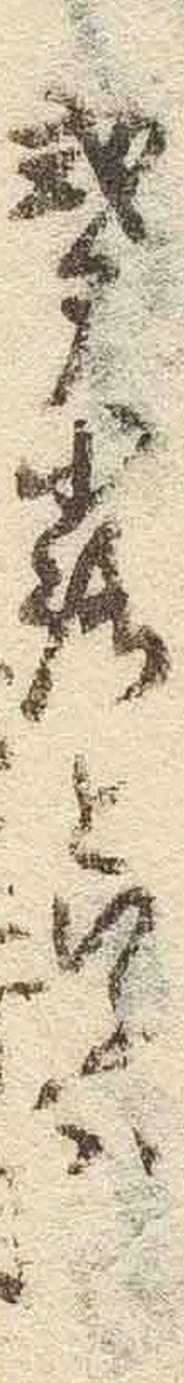式部小路といふは
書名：江戸町独案内
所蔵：東京学芸大学附属図書館 国文学研究資料館
